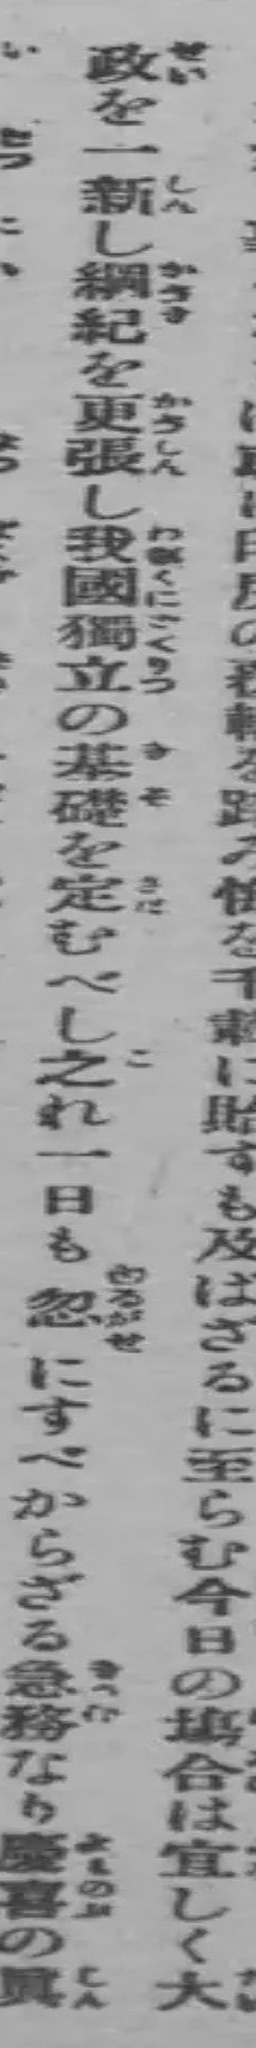政を一新し綱紀を更張し我国独立の基礎を定むべし之れ一日も忽にすべからざる急務なり慶喜の真
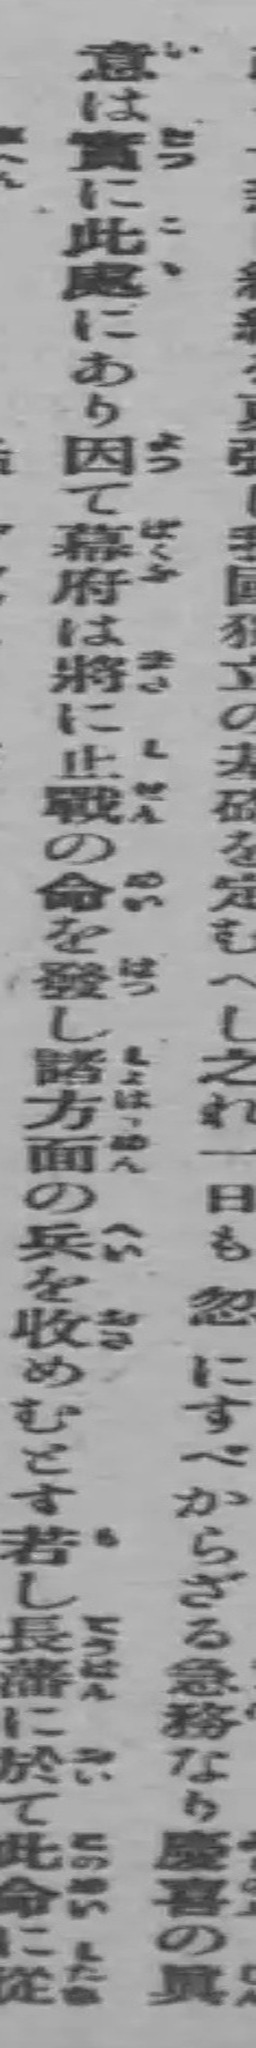意は実に此処にあり因て幕府は将に止戦の命を発し諸方面の兵を収めむとす若し長藩に於て此命に従
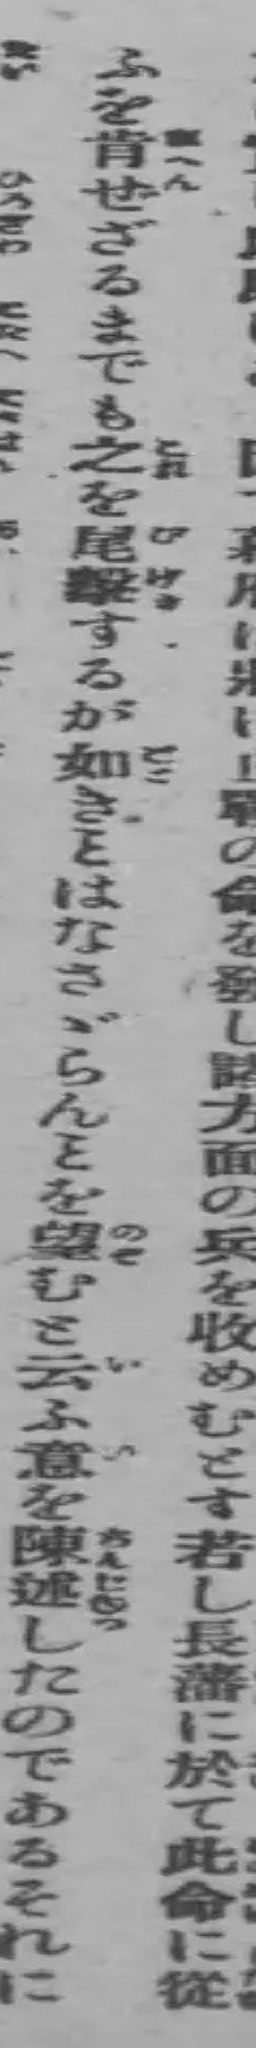ふを肯ぜざるまでも之を尾撃するが如きことはなさゞらんことを望むと云ふ意を陳述したのであるそれに
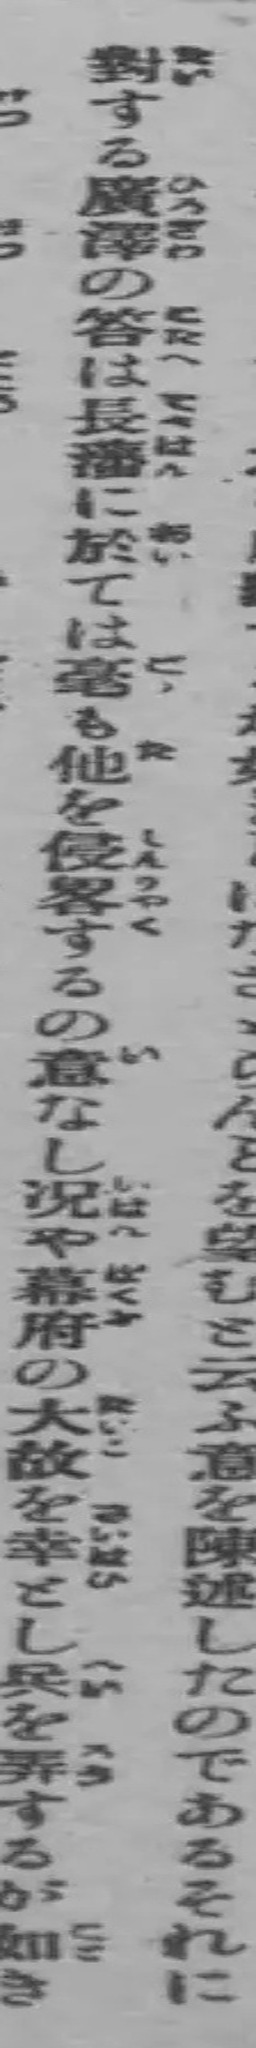対する廣澤の答は長藩に於ては毫も他を侵略するの意なし況や幕府の大故を幸とし兵を弄するが如き
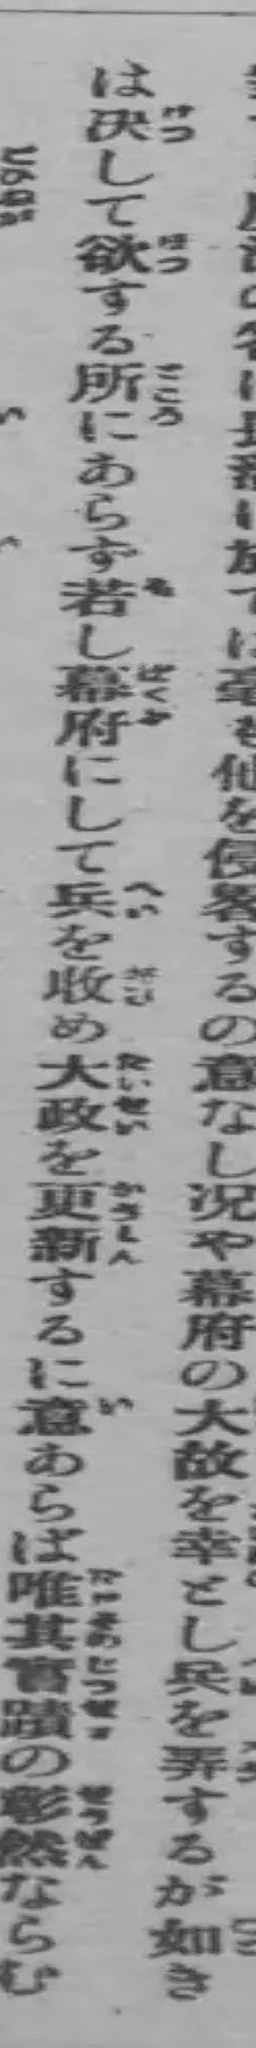は決して欲する所にあらず若し幕府にして兵を収め大政を更新するに意あらば唯其実蹟の彰然ならむ
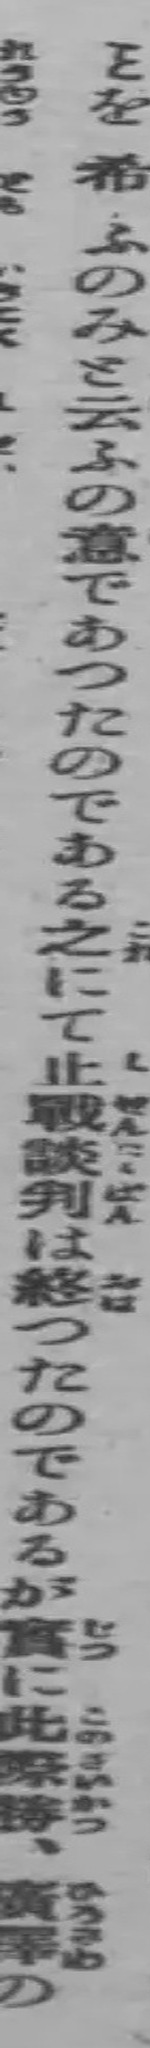ことを希ふのみと云ふの意であつたのである之にて止戦談判は終つたのであるが実に此際勝、廣澤の
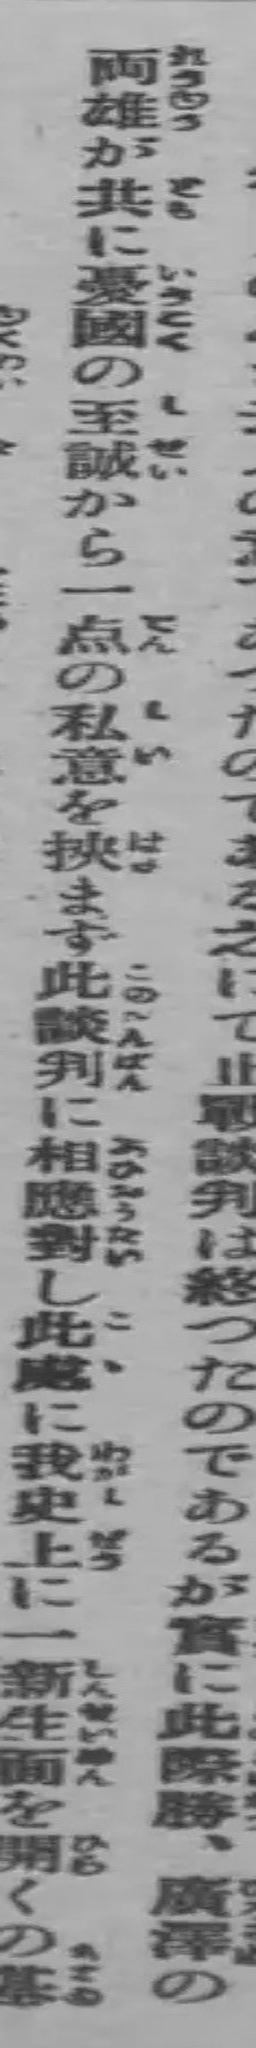両雄が共に憂国の至誠から一点の私意を挟まず此談判に相応対し此処に我史上に一新生面を開くの基
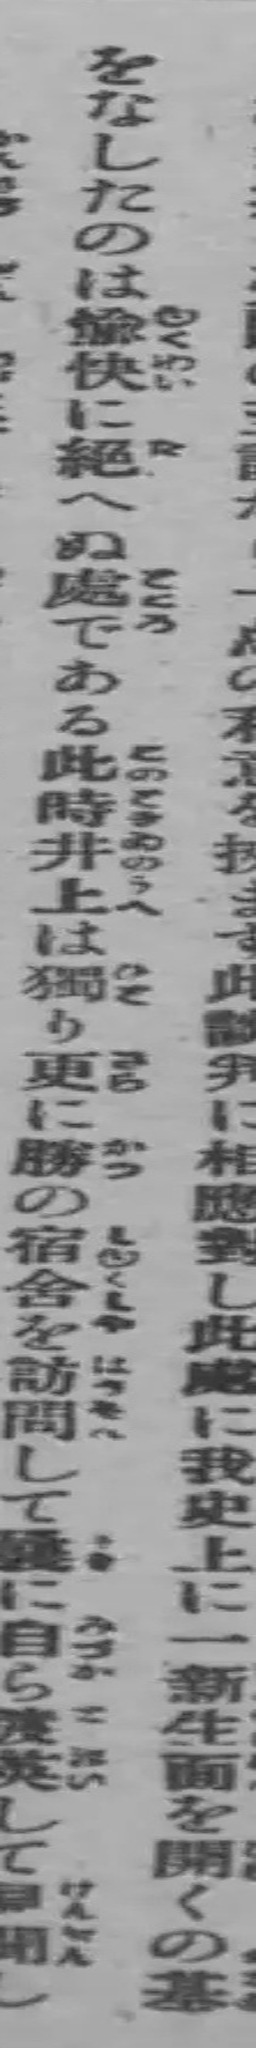をなしたのは愉快に絶へぬ処である此時井上は独り更に勝の宿舎を訪問して曩に自ら渡英して見聞し
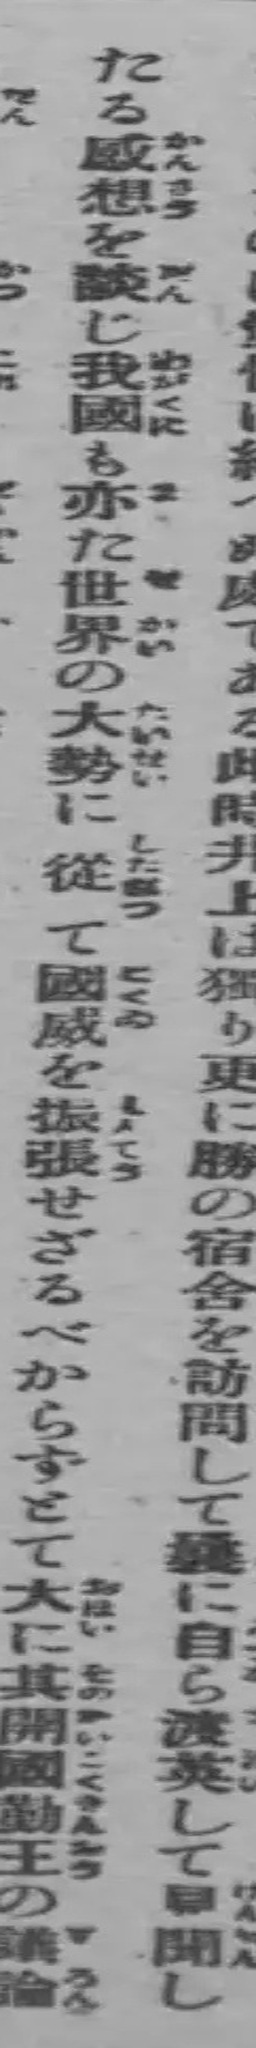たる感想を談じ我国も亦た世界の大勢に従て国威を振張せざるべからずとて大に其開国勤王の議論
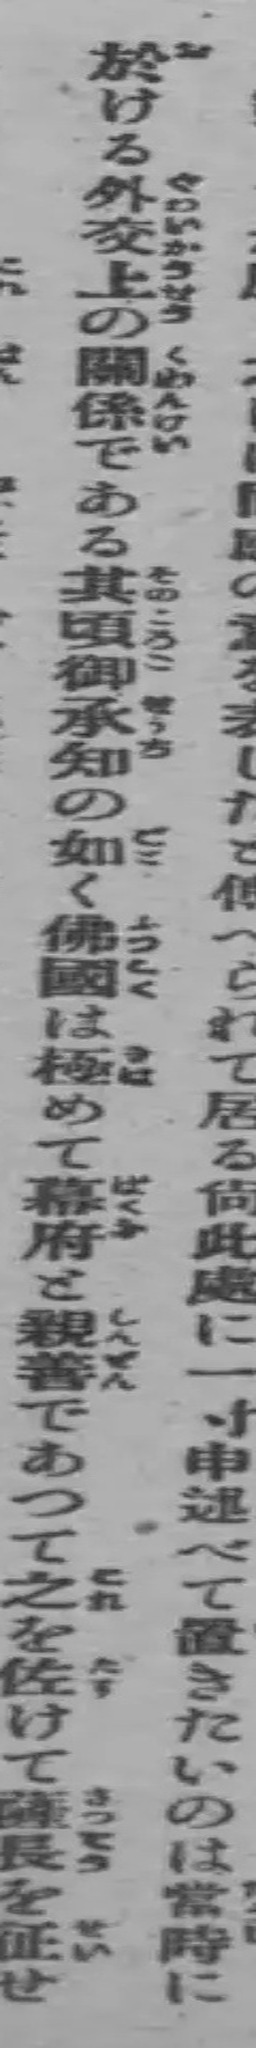於ける外交上の関係である其頃御承知の如く仏国は極めて幕府と親善であつて之を佐けて薩長を征せ
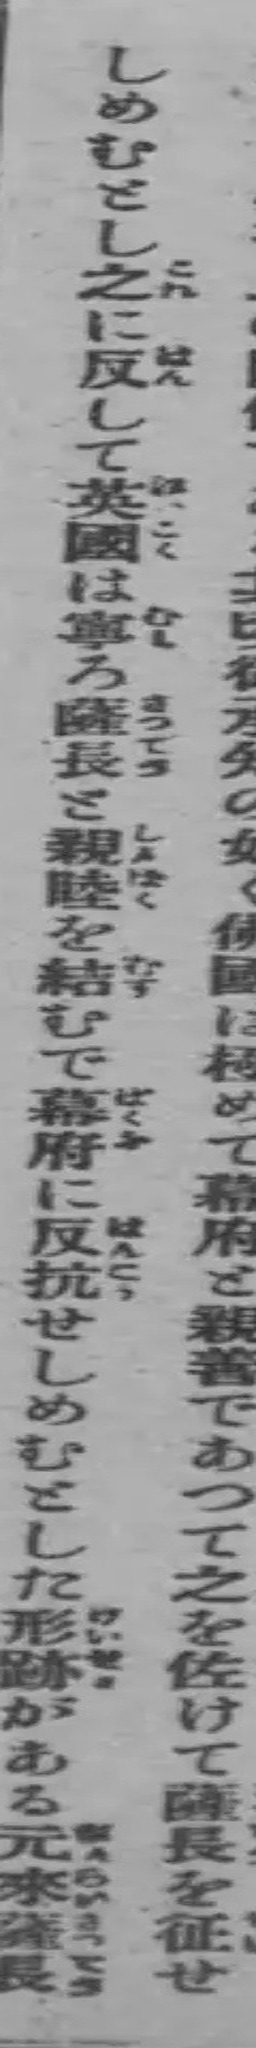しめむとし之に反して英国は寧ろ薩長と親睦を結むで幕府に反抗せしめむとした形跡がある元来薩長
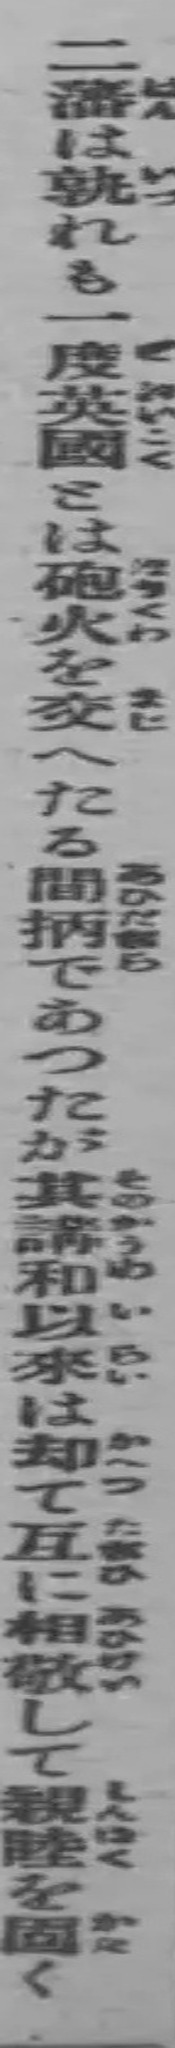二藩は孰れも一度英国とは砲火を交へたる間柄であつたが其講話以来は却て互に相敬して親睦を固く
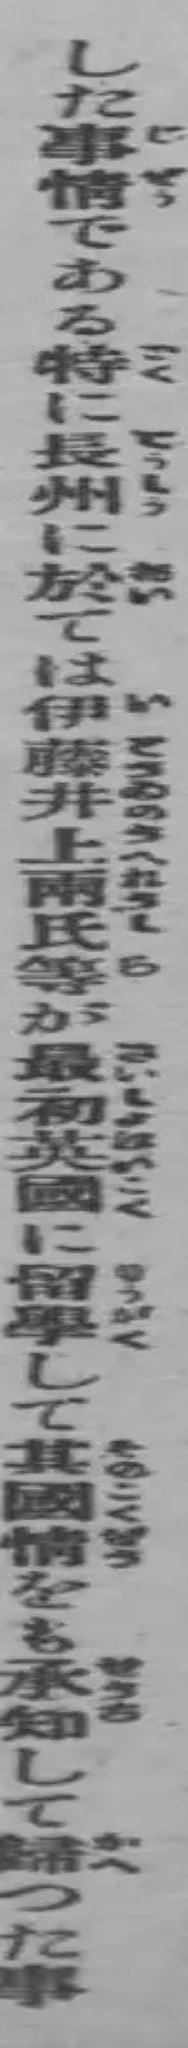した事情である特に長州に於ては伊藤井上両氏等が最初英国に留学して其国情をも承知して帰つた事
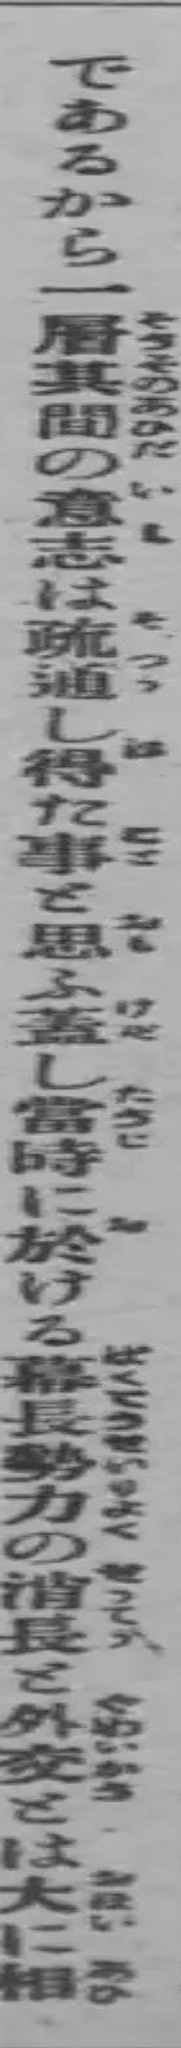であるから一層其間の意志は疎通し得た事と思ふ蓋し当時に於ける幕長勢力の消長と外交とは大に相
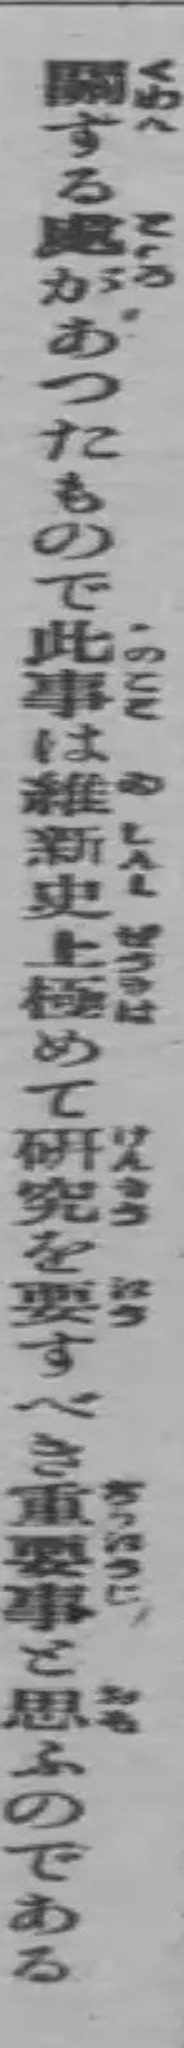関する処があつたもので此事は維新史上極めて研究を要すべき重要事と思ふのである
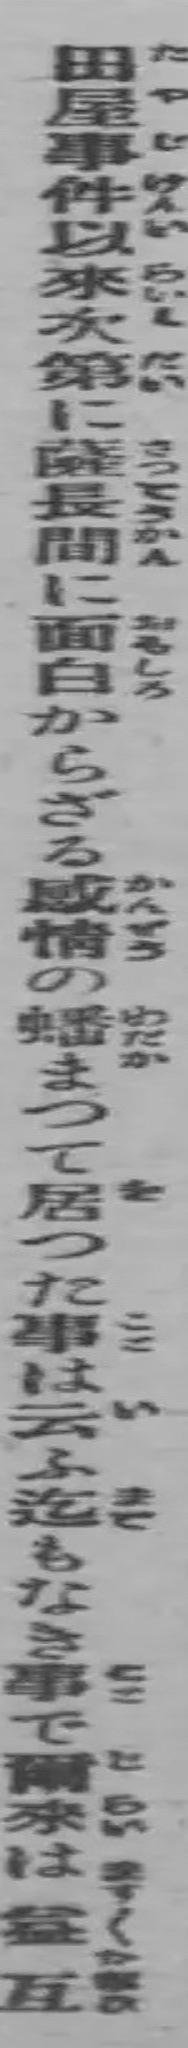田屋事件以来次第に薩長間に面白からざる感情の蟠まつて居つた事は云ふ迄もなき事で爾来は益互
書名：豊橋市史談
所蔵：国立国会図書館 National Diet Library, JAPAN
